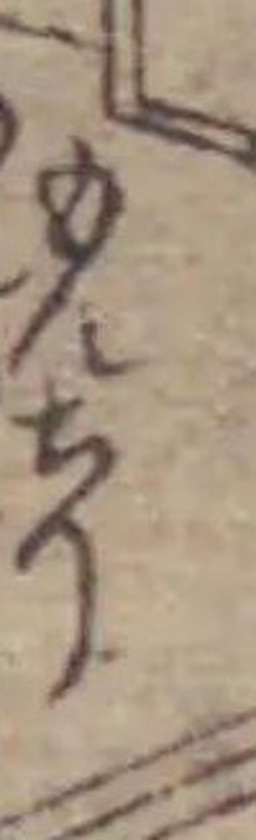もんちり
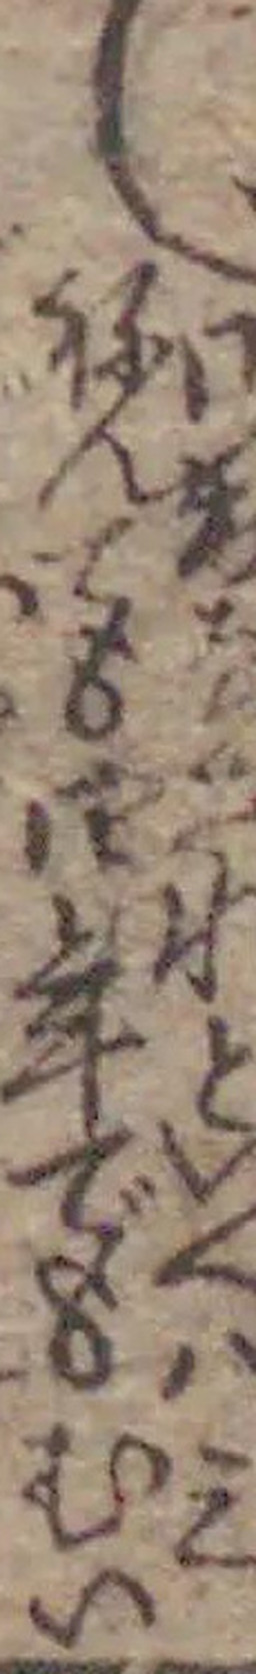ねんても四年でもむい
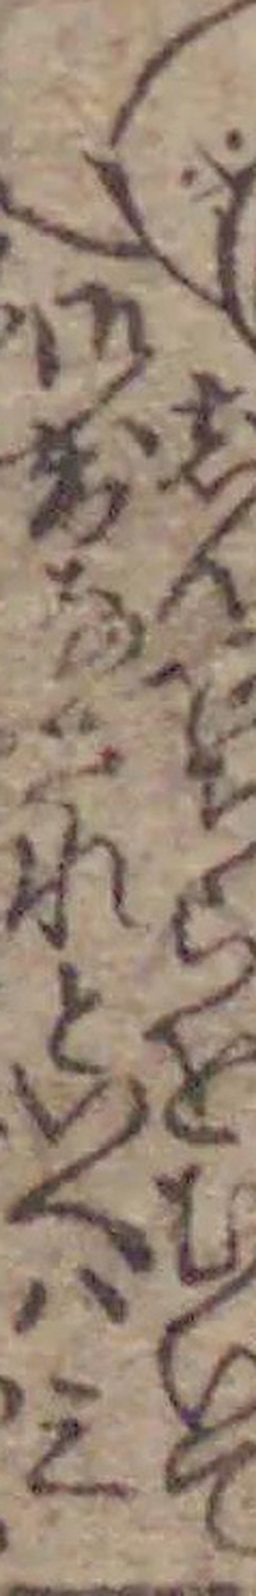御出なされといへば三
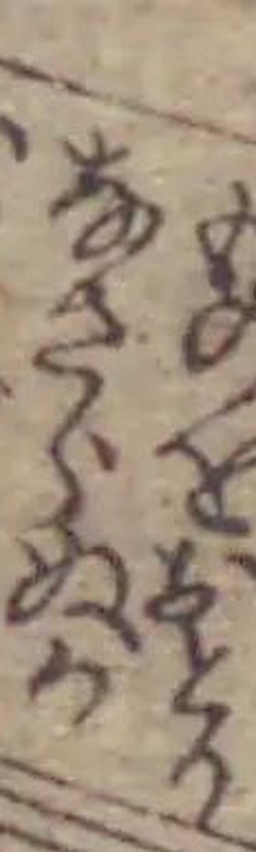なさらぬか
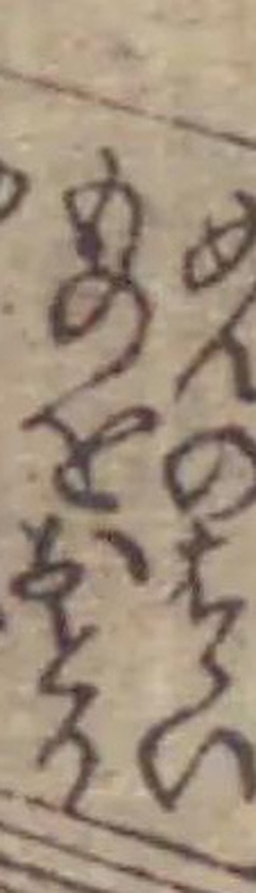ものをおとり
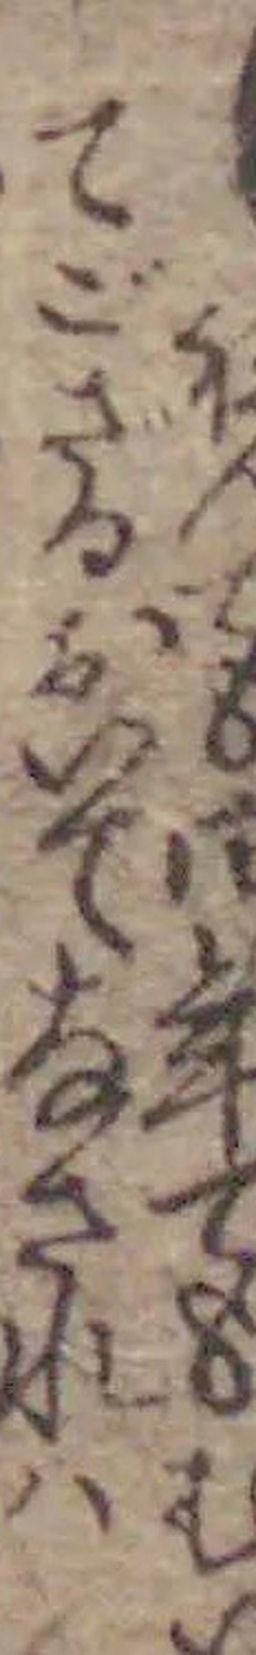てござるおいてなされは
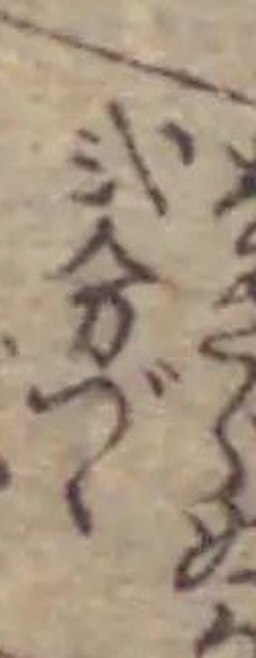弐分づゝ
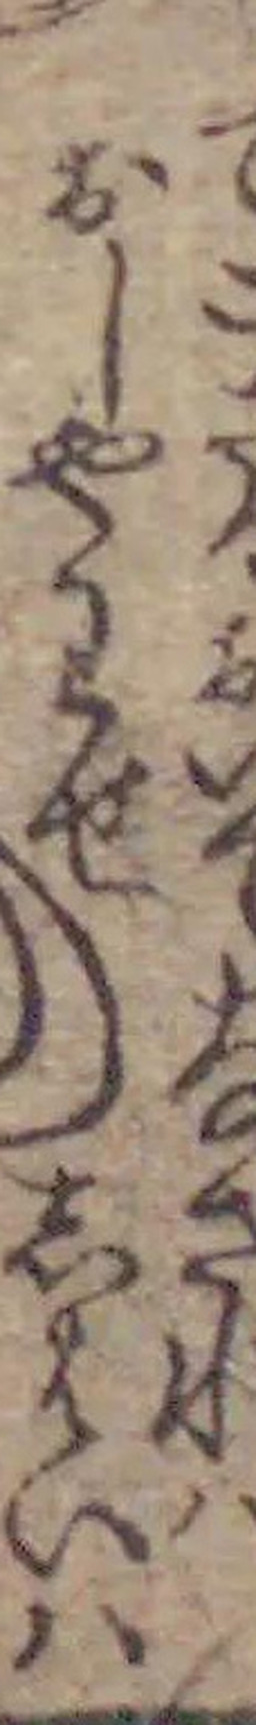おしやわせしはいは
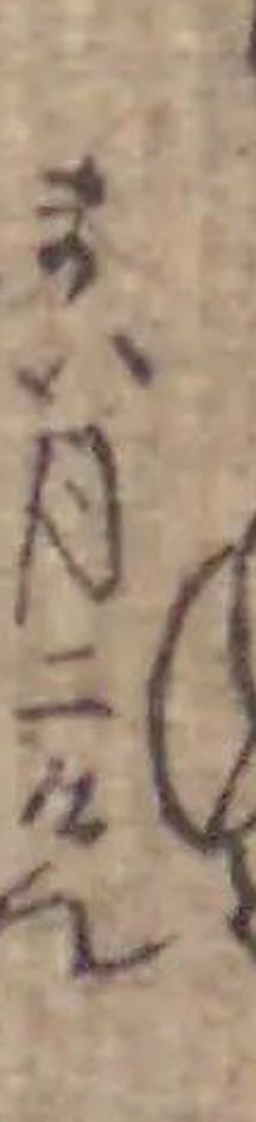まい月二けん
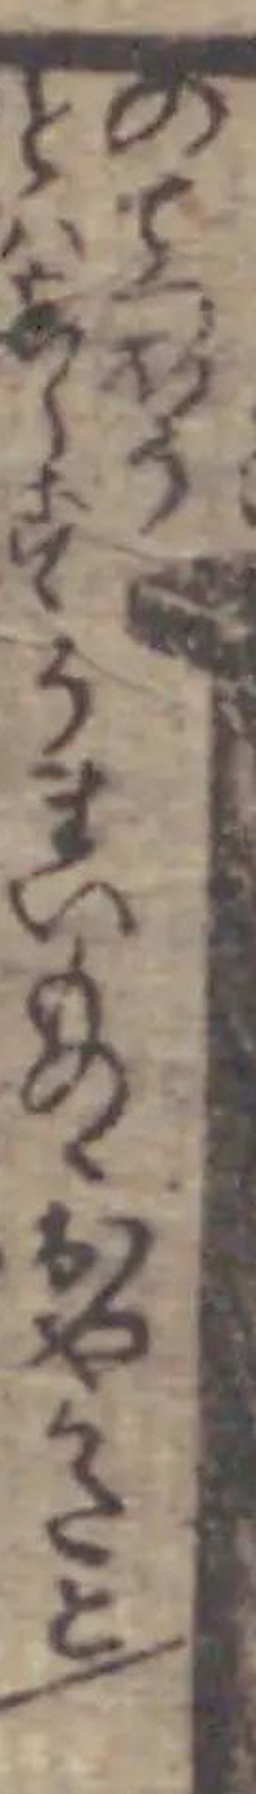とはしらすうまいものゝおやかたと
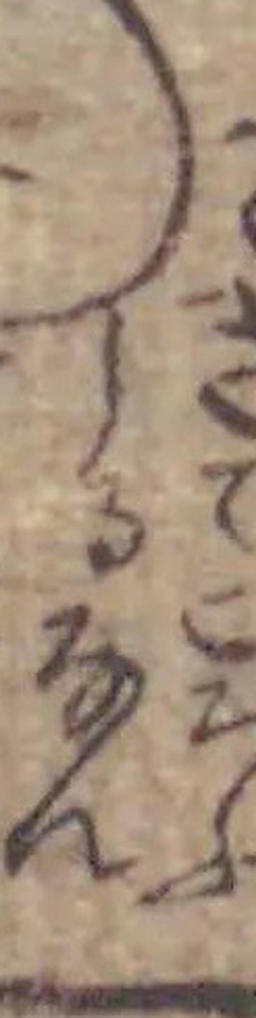しろなん
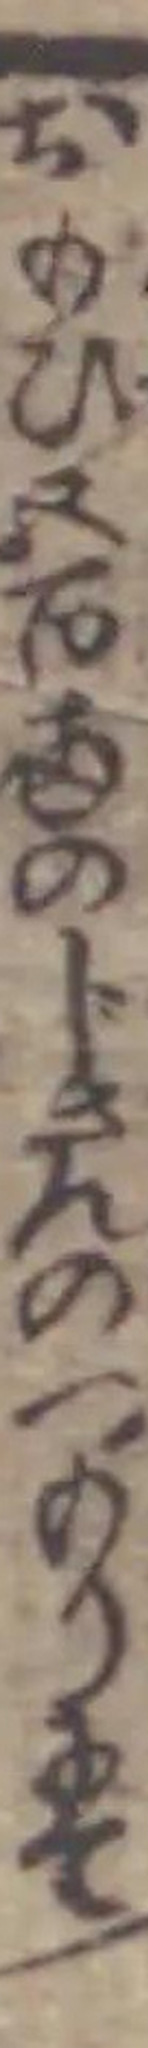おもひ五百両じさんのつもりにて
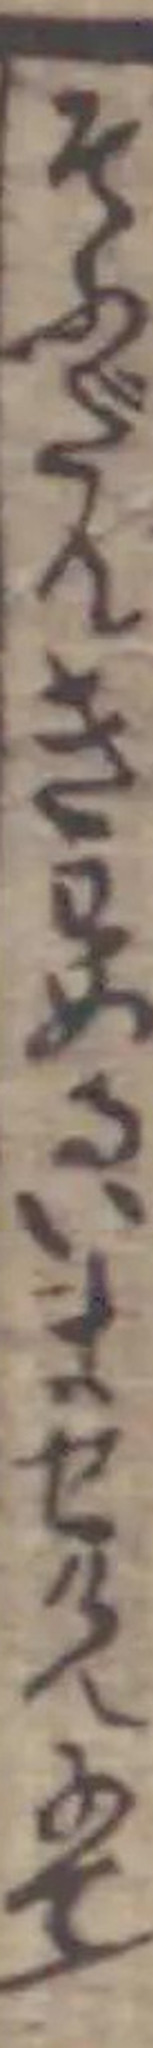そふだんきわめるいませけんにて
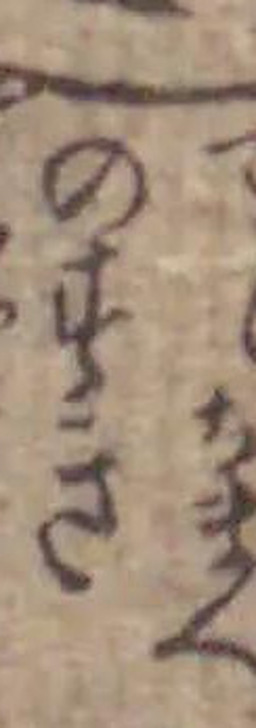のすき
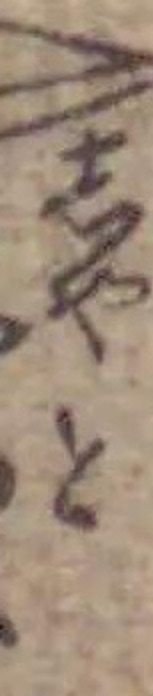しやと
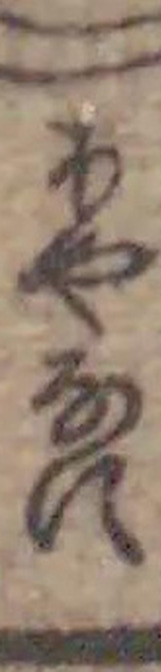あやなす
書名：虚言弥二郎傾城誠 3巻
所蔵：国立国会図書館 National Diet Library, JAPAN
